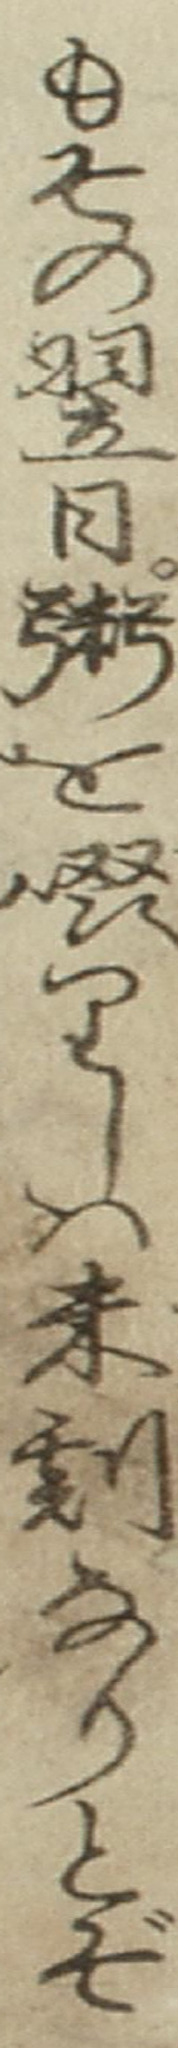も翌日。粥を啜りしは未刻なりとぞ
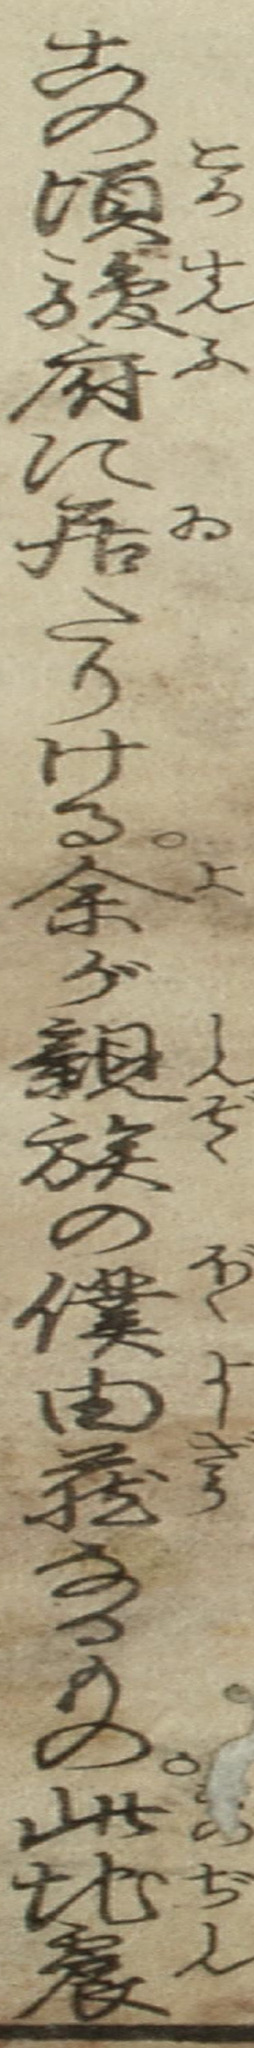この頃駿府に居たりける余が親族の僕由蔵なるもの。此地震
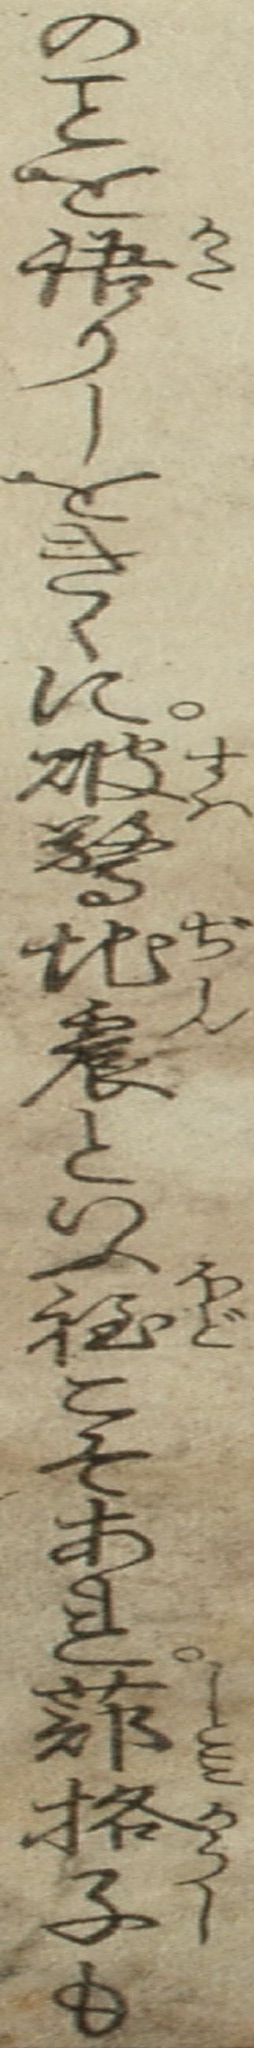のことを語りしをきくに。破驚地震といふ程こそあれ。蔀格子も
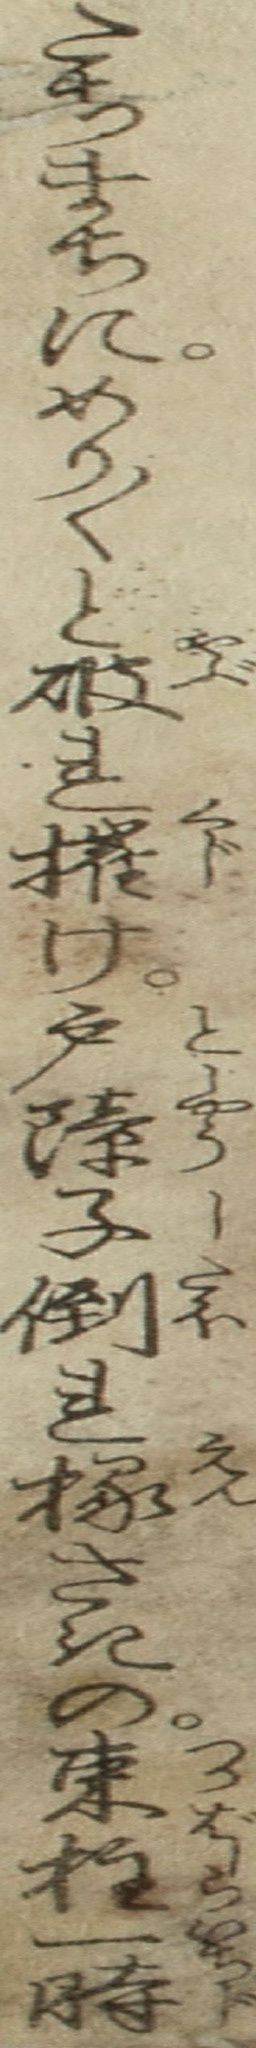たちまちに。めり〳〵と破れ挫け。戸障子倒れ縁さきの。束柱一時
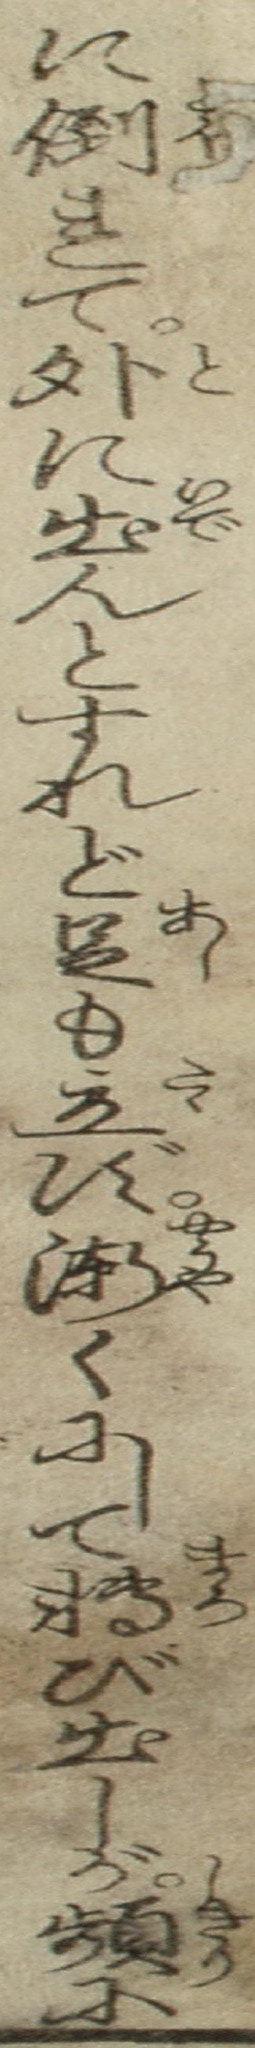に倒れて。外に出んとすれど足も立ず。漸くにして転び出しが。頻に
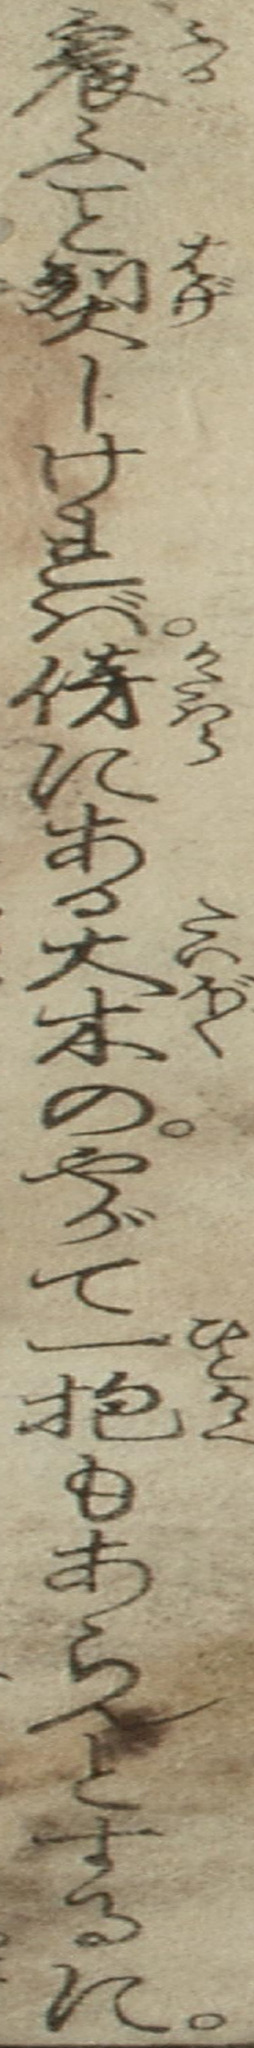震ふこと烈しければ。傍にある大木の。やがて一抱もあらんとするに。
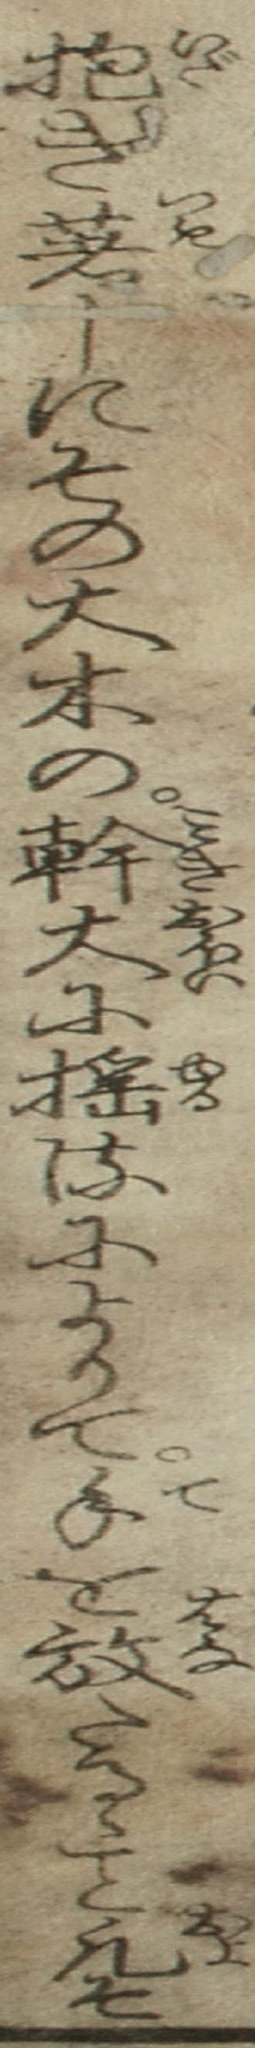抱き著しにその大木の幹大に揺るによりて。手を放たるゝこと凡そ

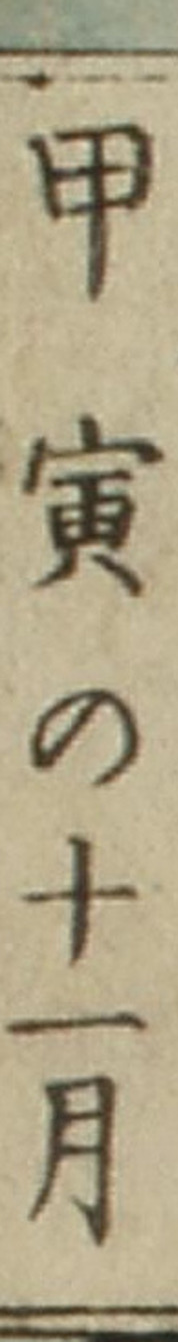甲寅の十一月
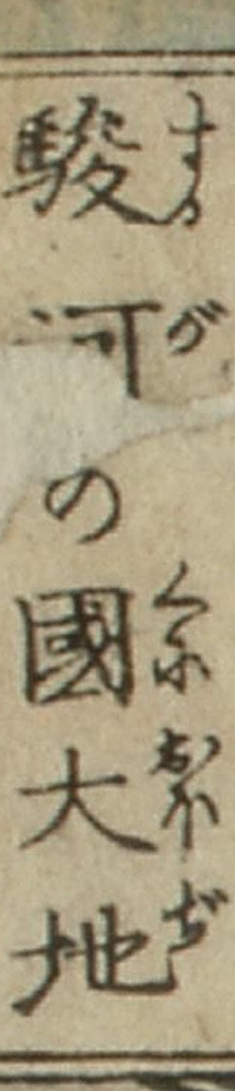駿河の国大地
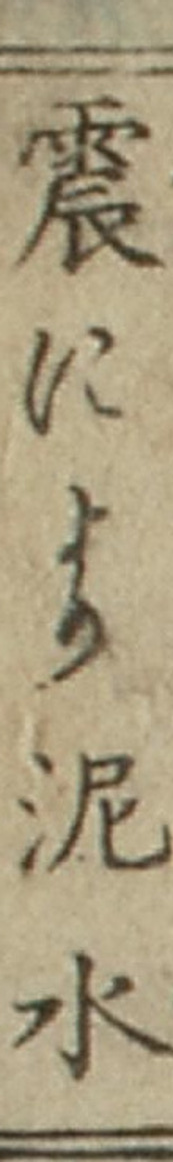震により泥水
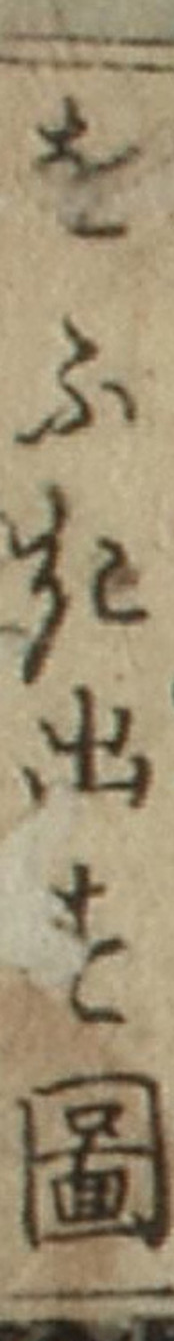をふき出す図

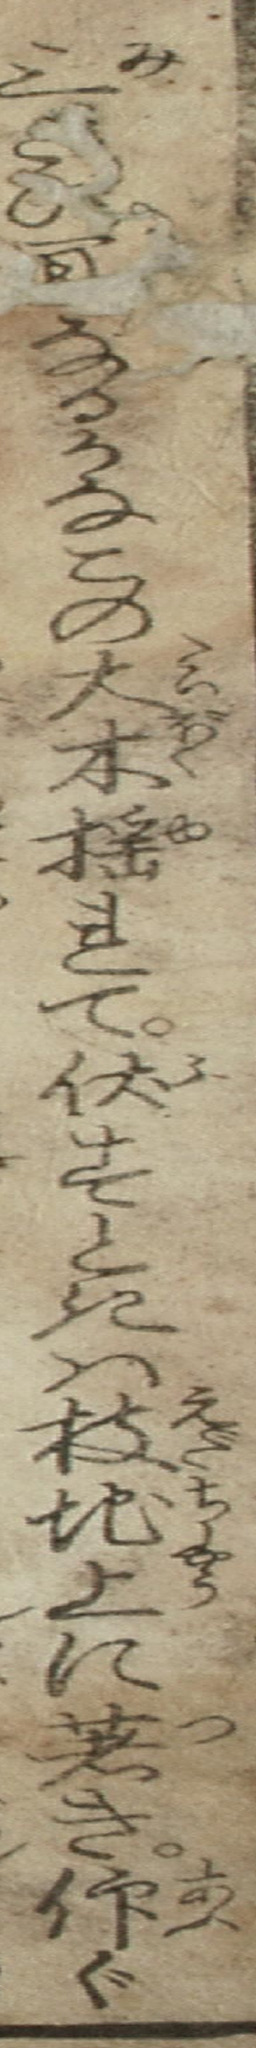三たび冝なるかなこの大木揺れて。伏すときは枝地上に著き。仰ぐ
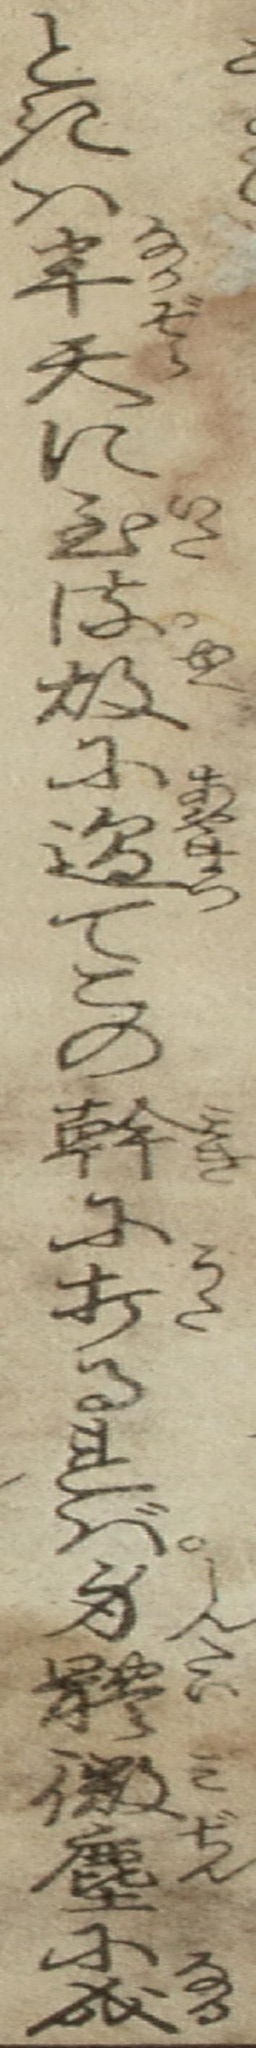ときは半天に至る。故に過てこの幹に打るれば。身體微塵に成
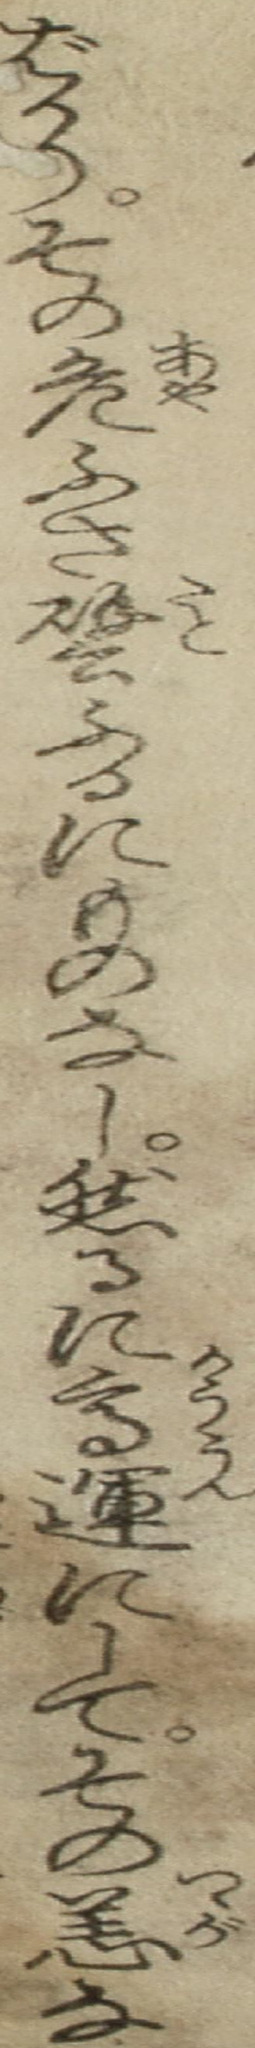ばかり。その危ふさ譬ふるにものなし。然るに高運にして。その恙な
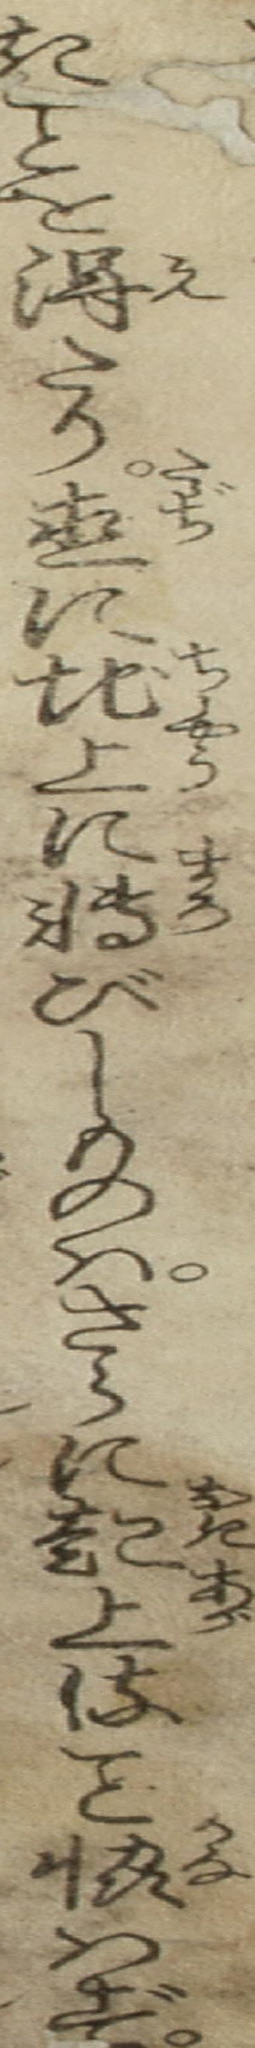きことを得たり。直に地上に轉びしものは。さらに起上ること協はず。
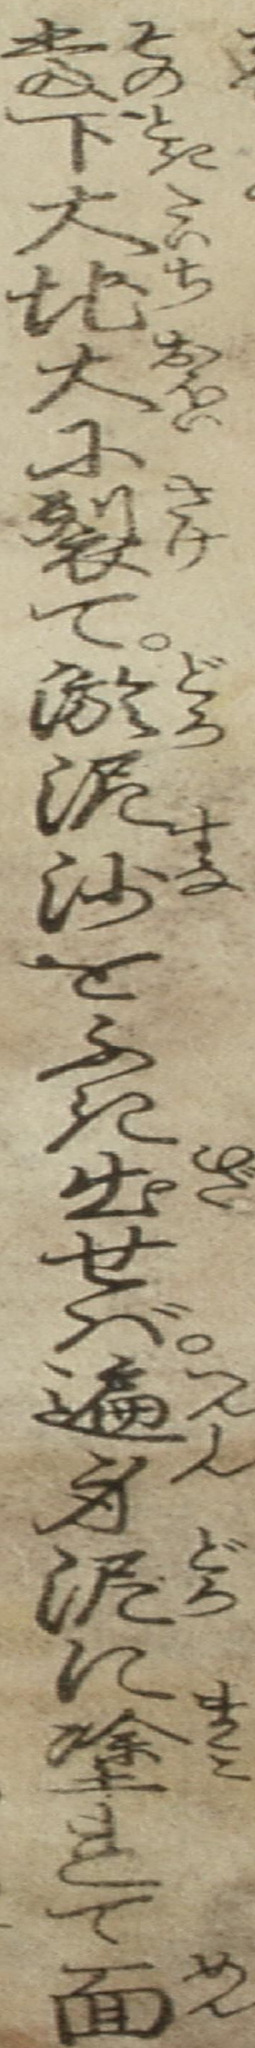當下大地大に裂て。淤泥沙をふき出せば。遍身泥に塗れて面
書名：安政見聞録　中
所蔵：東京大学地震研究所図書室 Earthquake Research Institute Library, The University of Tokyo, JAPAN
